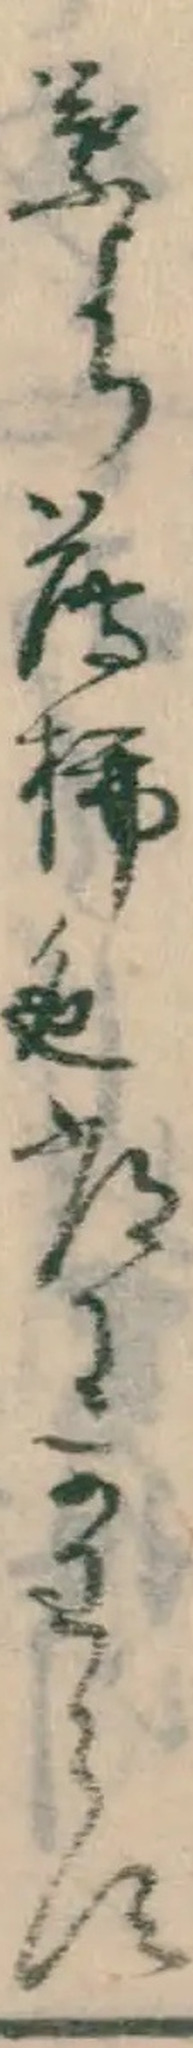葉より薄柿色常にかわらす
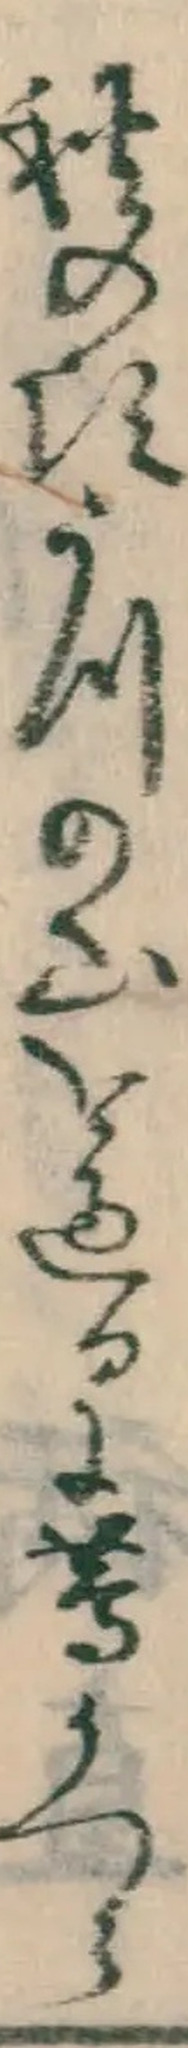秋の頃うつの山を過るに蔦かつら
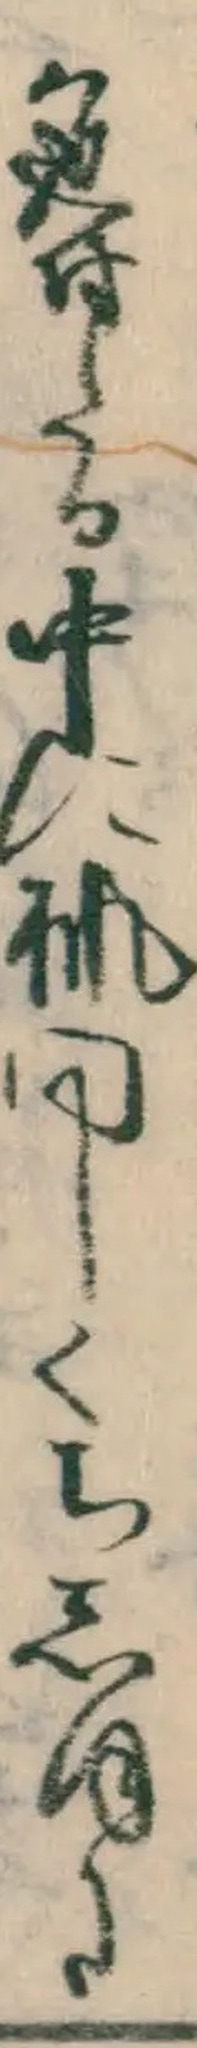色付たる中に楓同しくちしほに
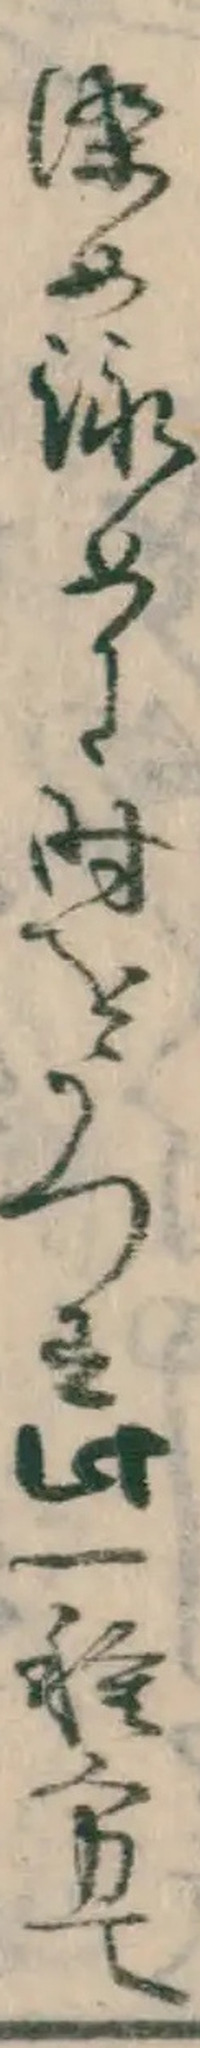染め詠めに時をうつす此一種分て
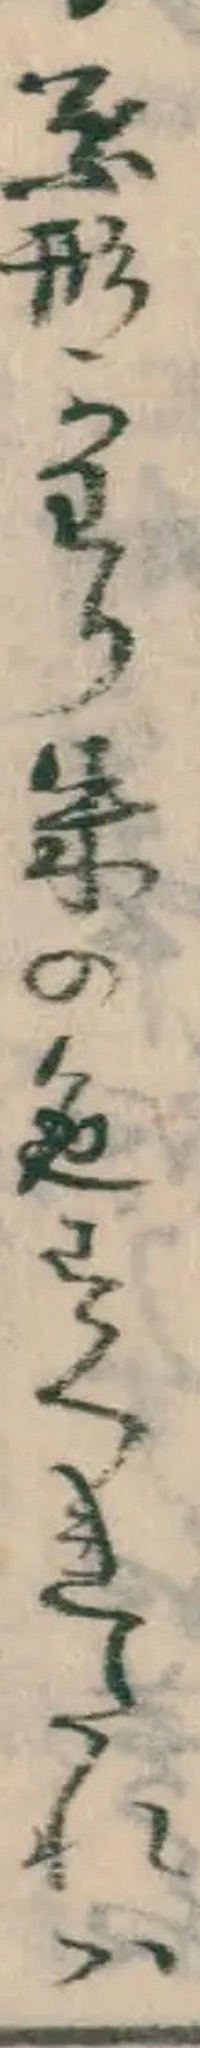葉形かわり朱の色すくれたれは
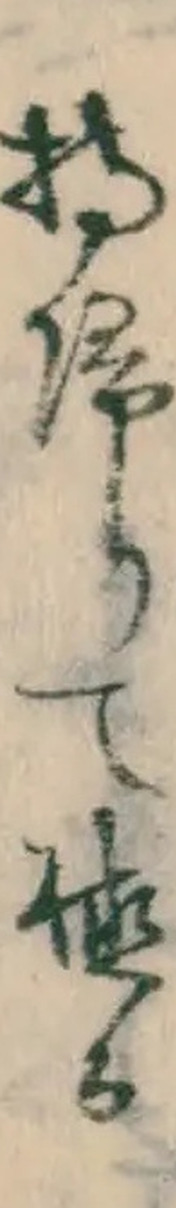持帰りて植る
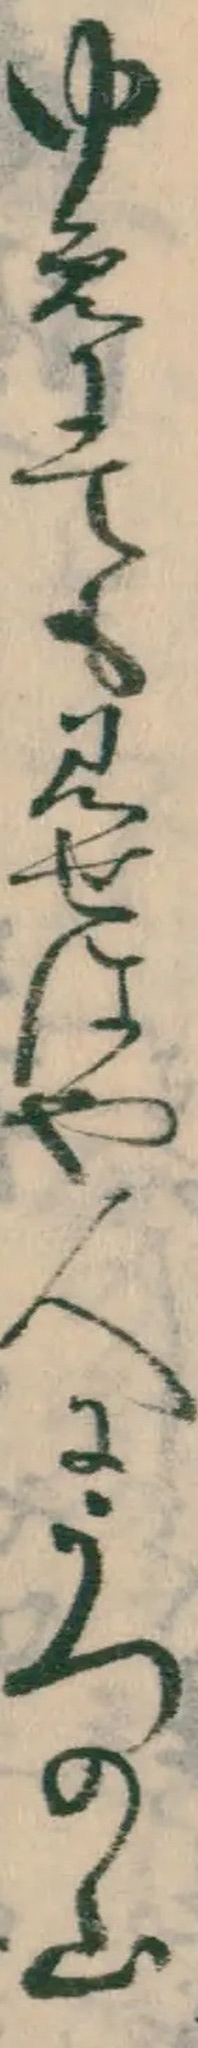ゆめにても見せはや人にうつの山
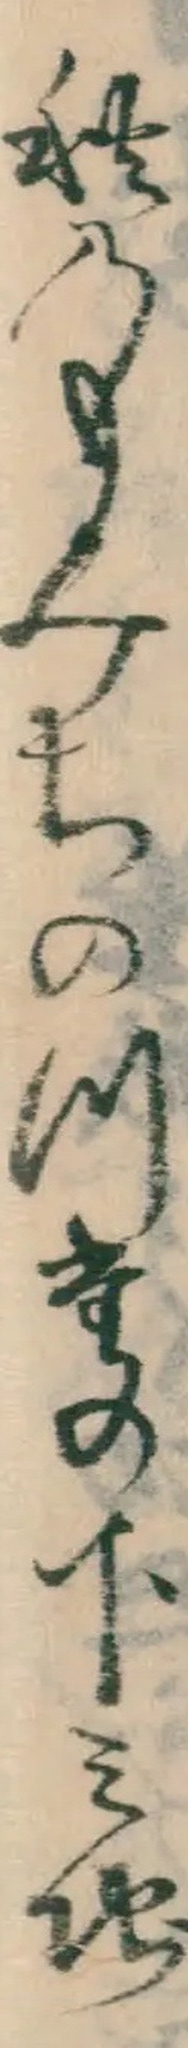秋のもみちのつたの下みち
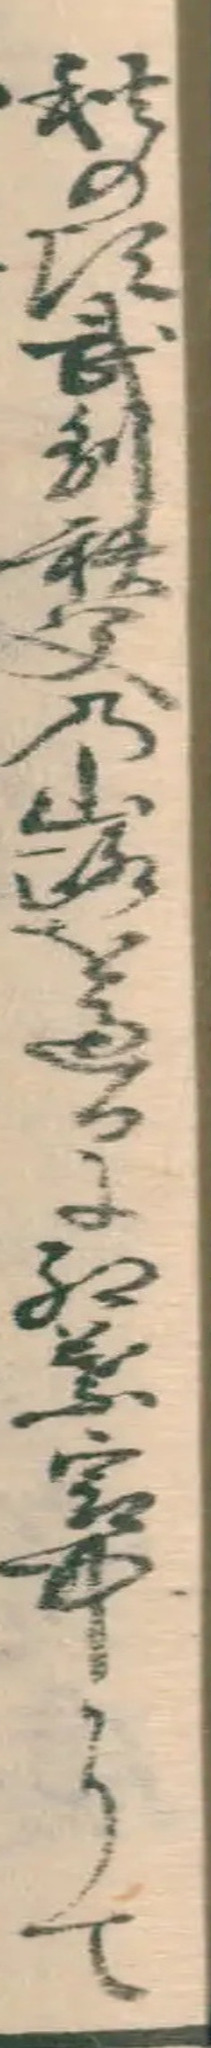水潜秋の頃武州秩父の山路を過るに紅葉最中にて
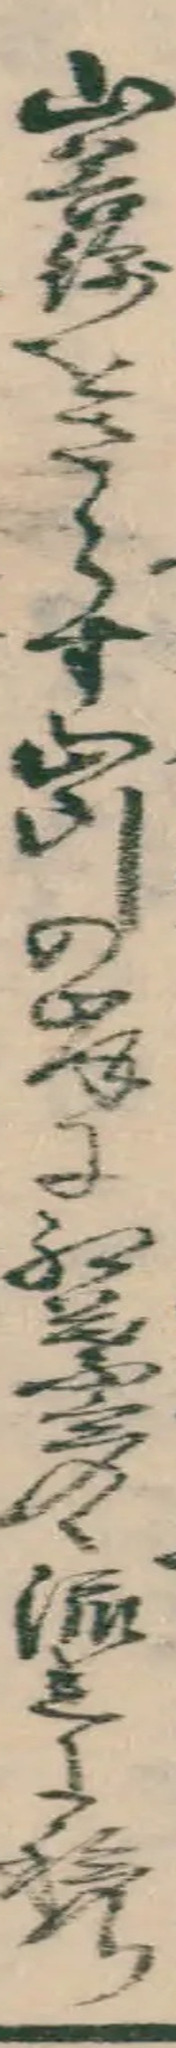山苔綿をさらす山川の岸に紅葉多く流れに移り
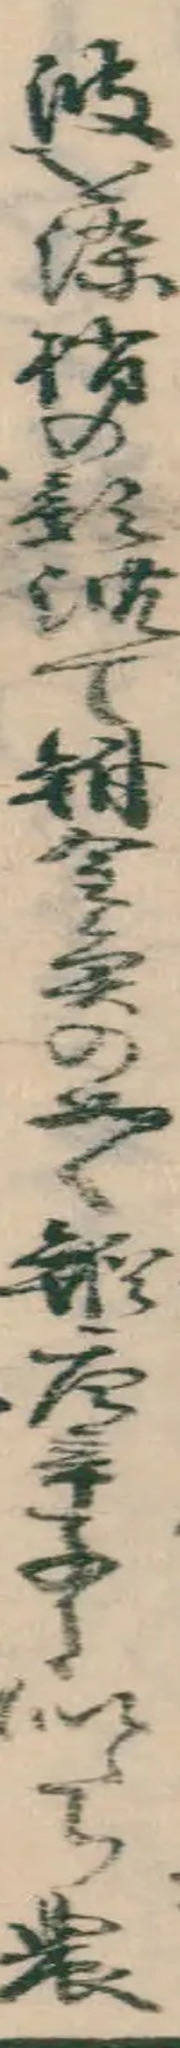波を染梢の影沈て鮒金魚の如く鰌唐辛子に似たり農
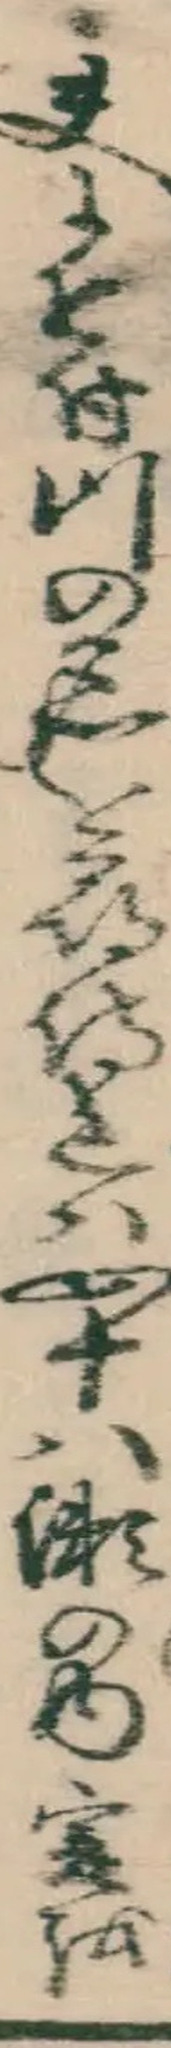夫に近付川の名を尋侍れは四十八瀬の内寔を
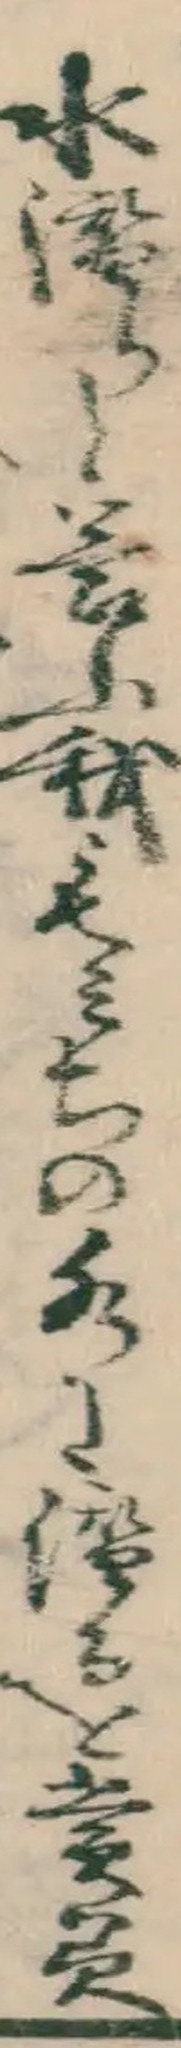水潜りと答ふ我もみちの水に潜るを賞美
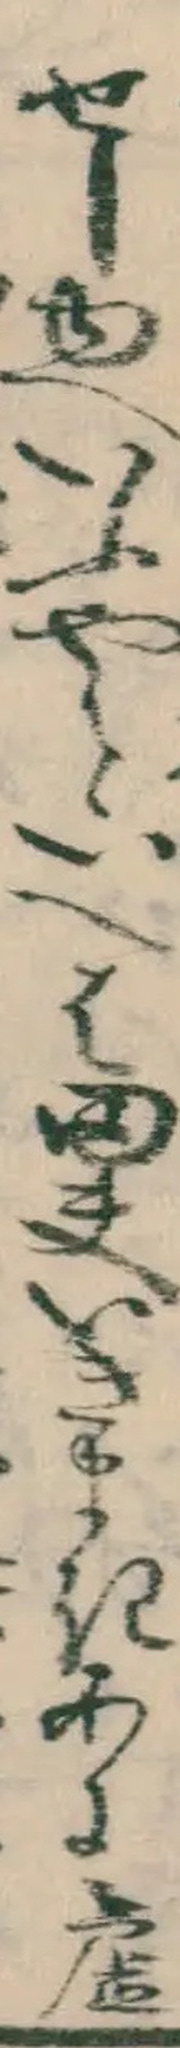せしゆへいふやといへは田夫いきまきあに虚
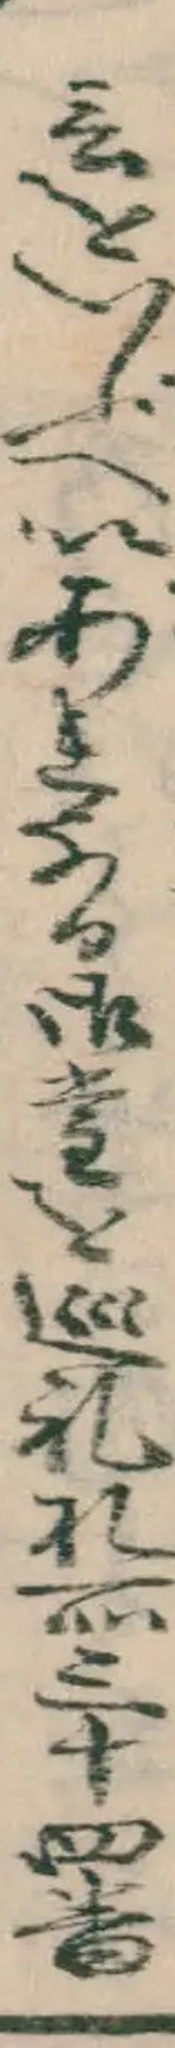言をいふへいあれなる御堂を巡礼札所三十四番
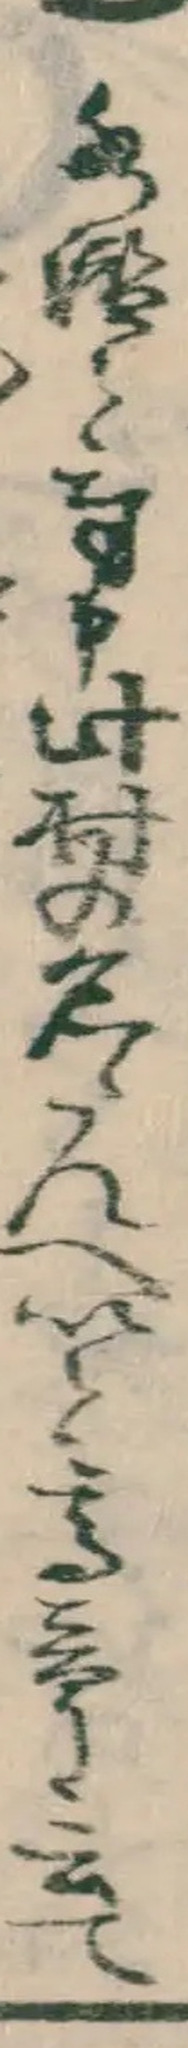水潜と奉申此村の名たんへいと高音に云て
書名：紅葉集
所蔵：国立国会図書館 National Diet Library, JAPAN
